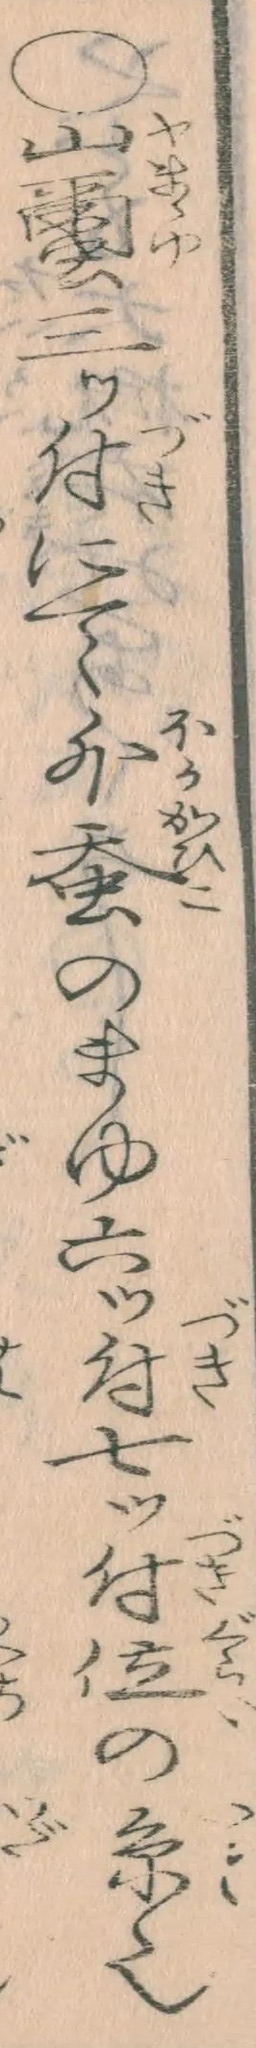○山繭三ツ付にて外蚕のまゆ六ツ付位の糸也
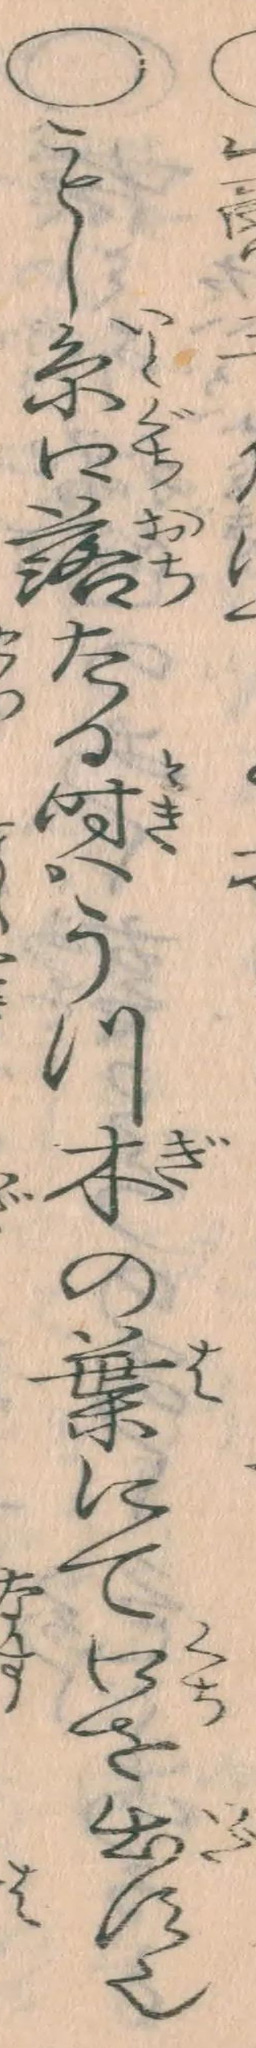○もし糸口落たる時はうつ木の葉にて口を出す也
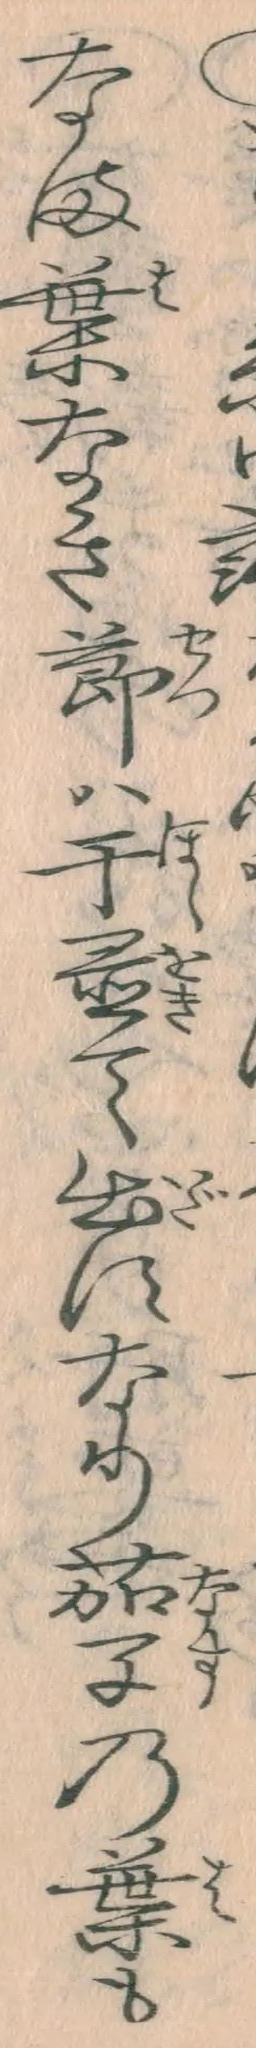なま葉なき節は干置て出すなり茄子の葉も
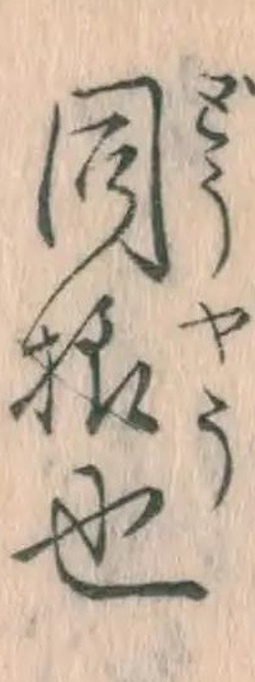同様也
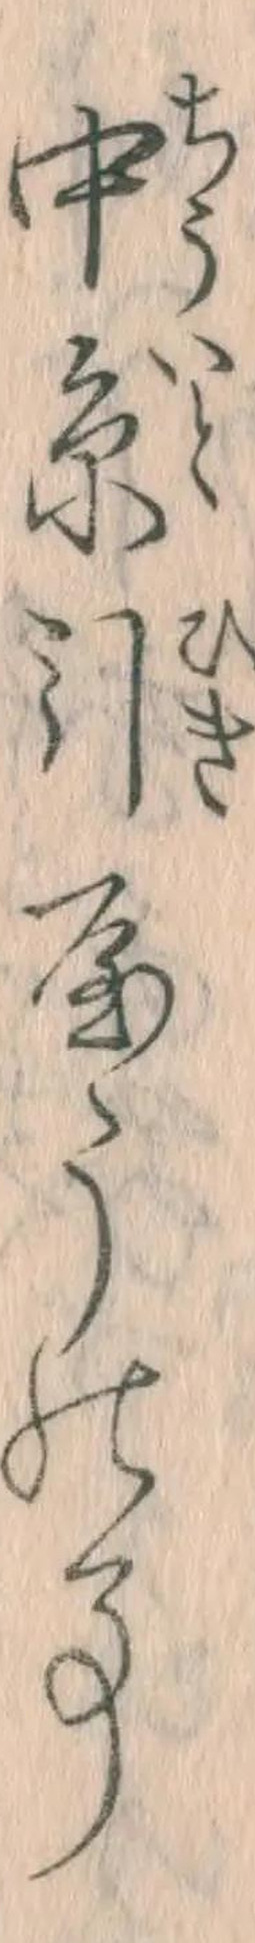中糸引やうの事
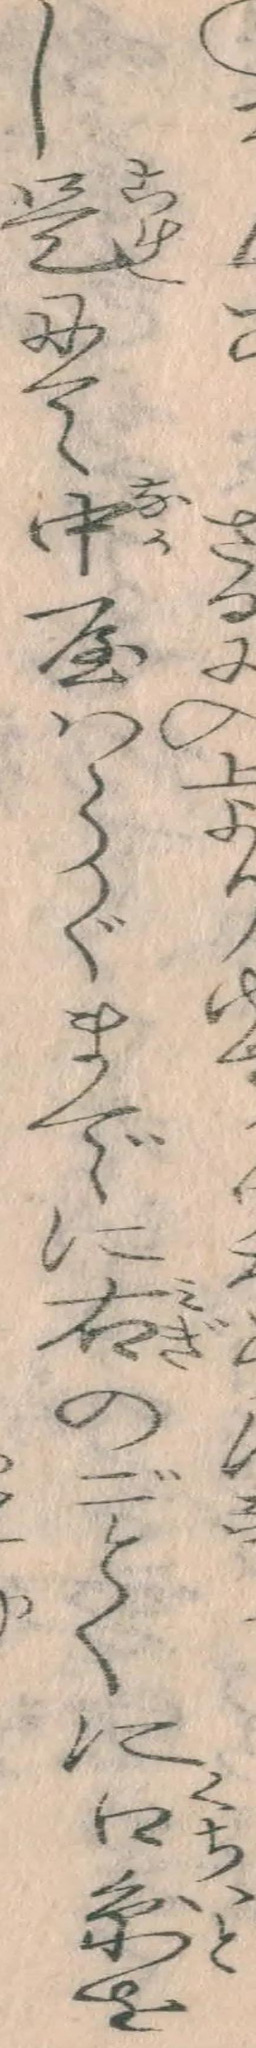し是にて中やはらぐまでに右のごとくに口糸を
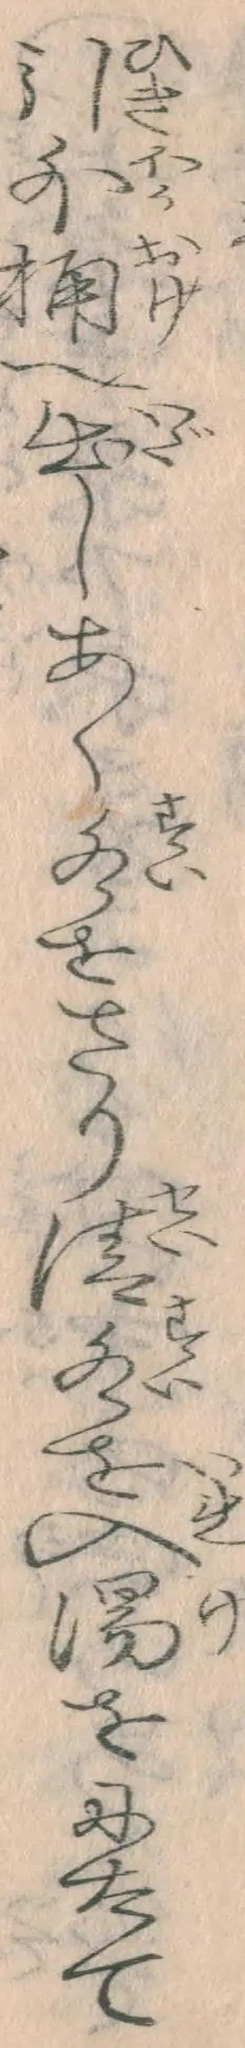引外桶へ出しあく水をさり清水を入湯をにたて
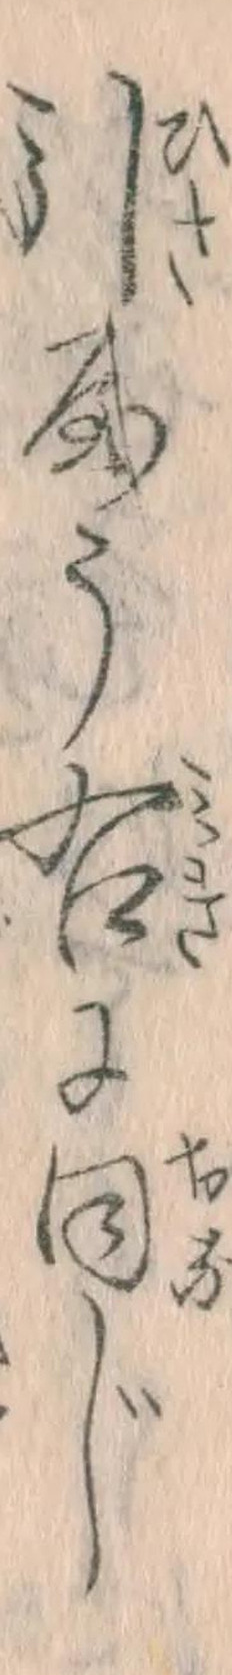引やう右に同じ
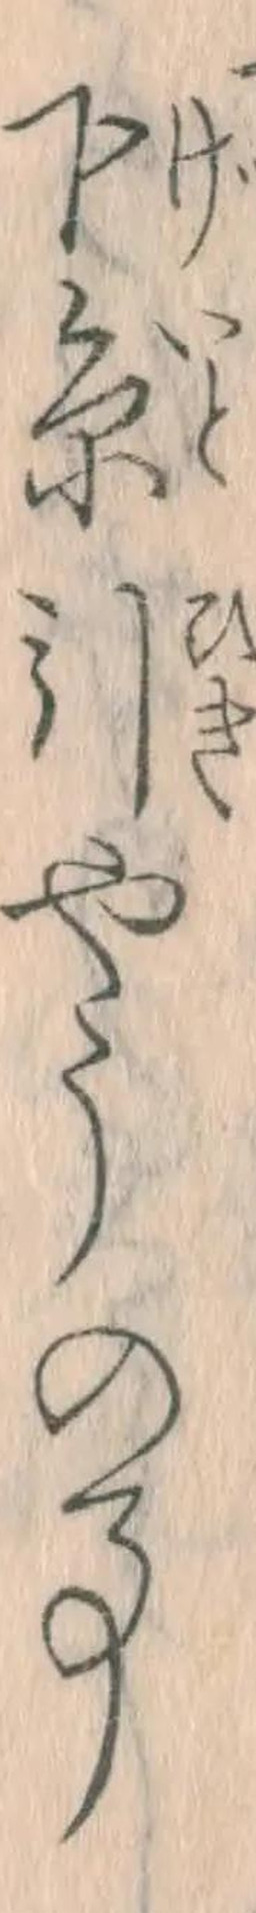下糸引やうの事
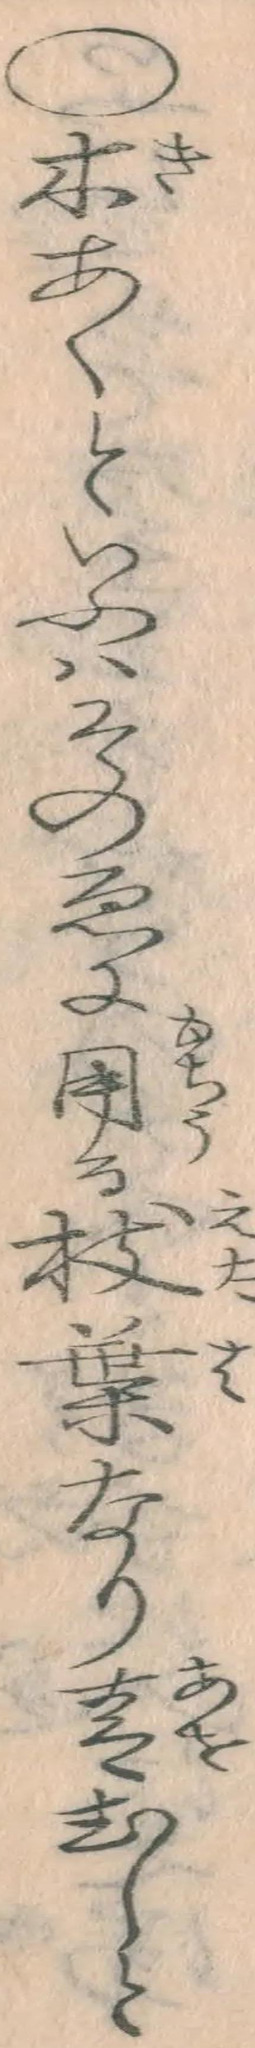○木あくといふはそのゑに用る枝葉なり青むしと

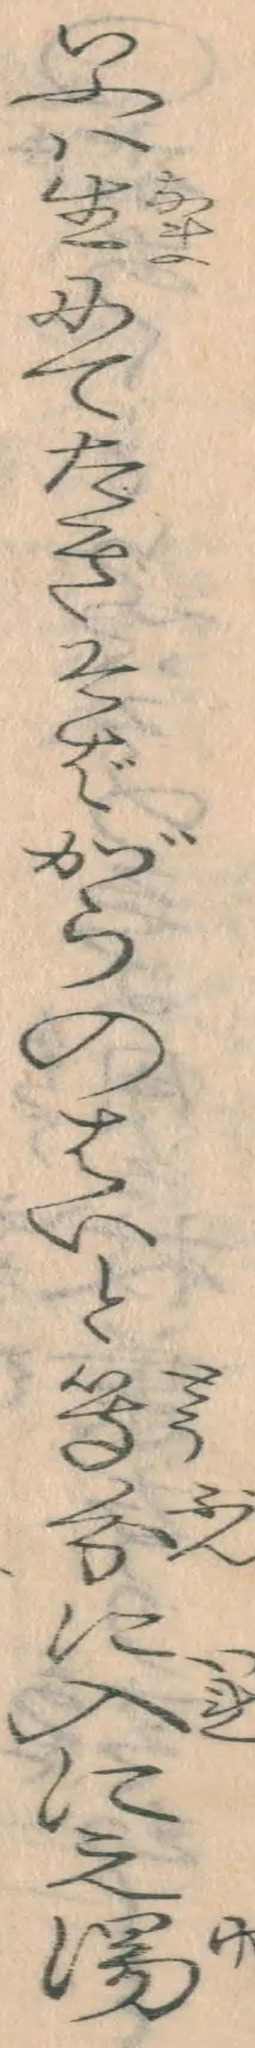いふは生にてたきそばがらのはいと等分に入にえ湯
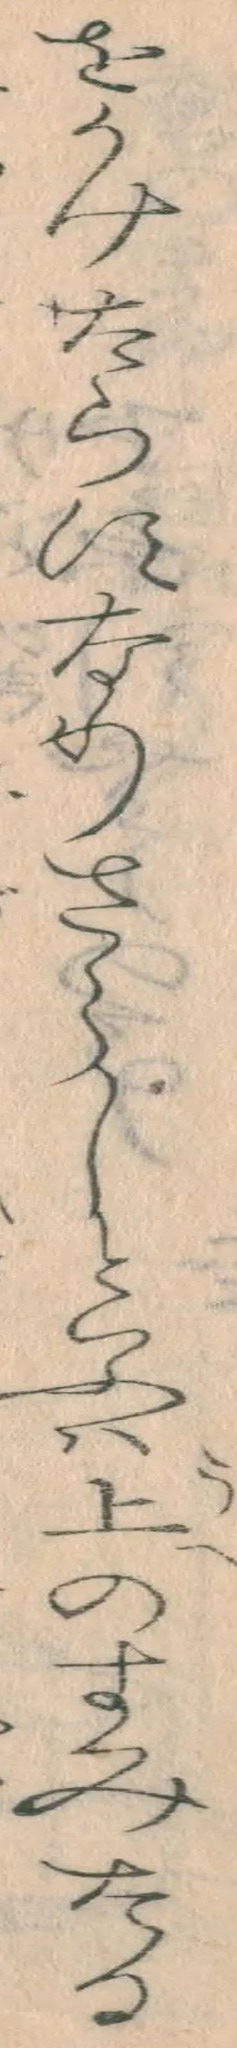をかけたらすなりさらしといふは上のすみたる
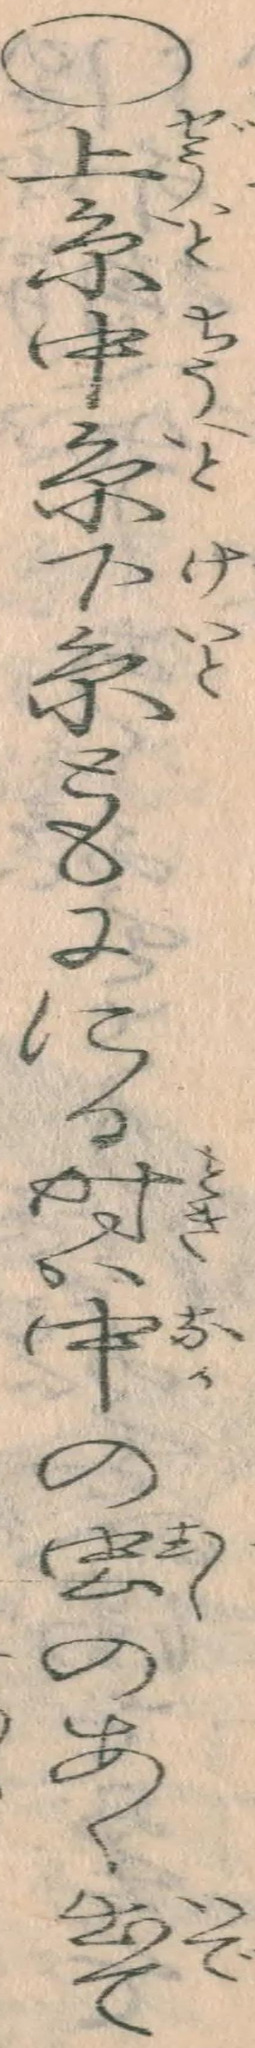○上糸中糸下糸ともににる時は中の虫のあく出て
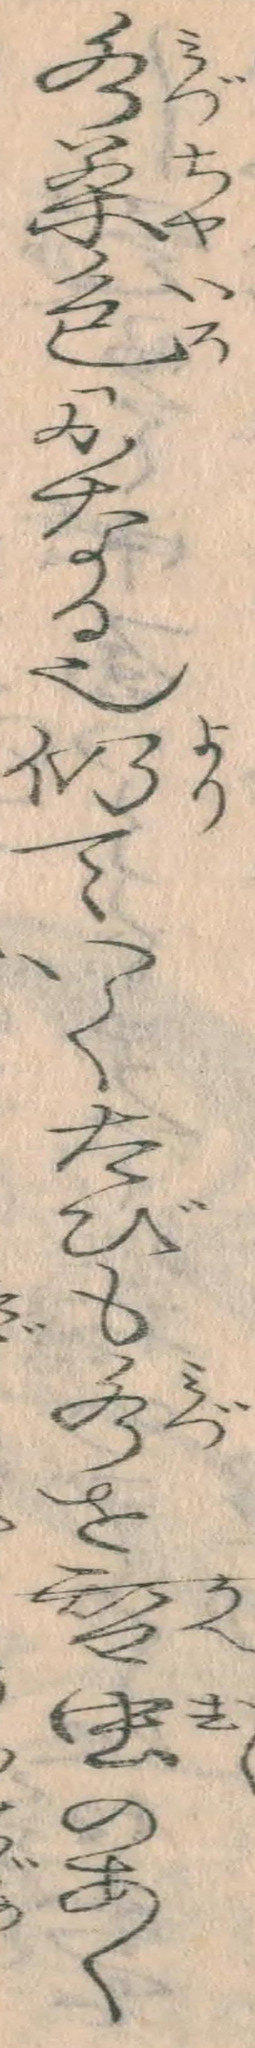水茶色になる也仍ていくたびも水を変虫のあく
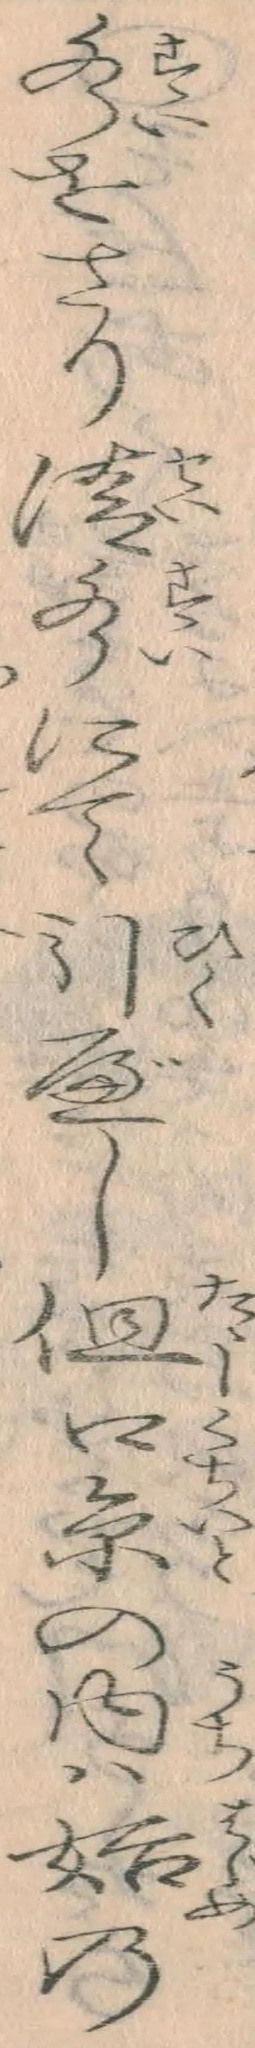水をさり清水にて引べし但口糸の内は始の
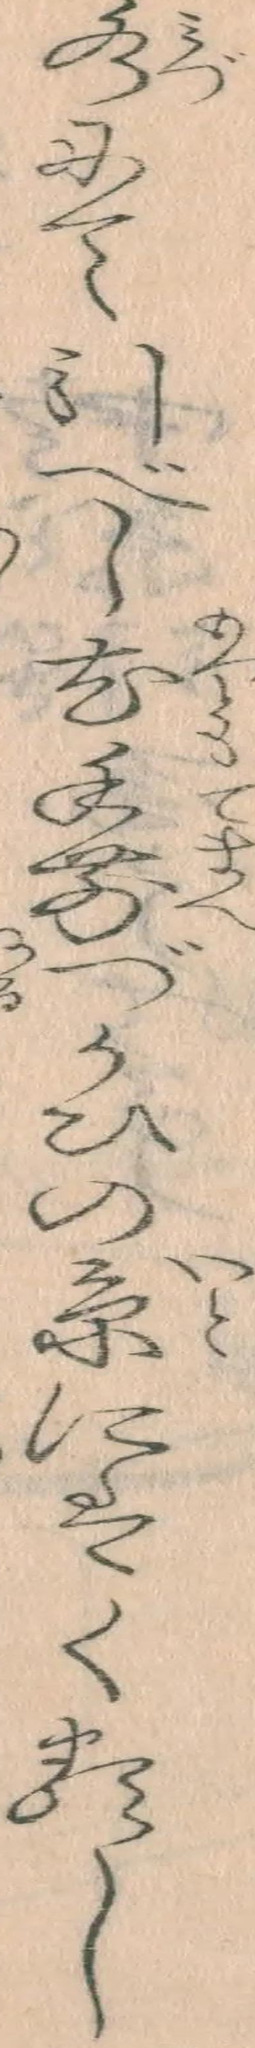水にて引べし尤手前づかひの糸にはくるし
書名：山繭養法秘傳抄
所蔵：国立国会図書館 National Diet Library, JAPAN
